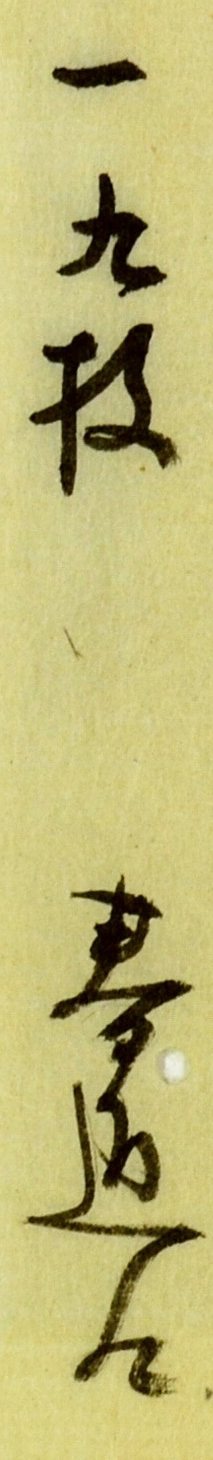一九枚春近郷

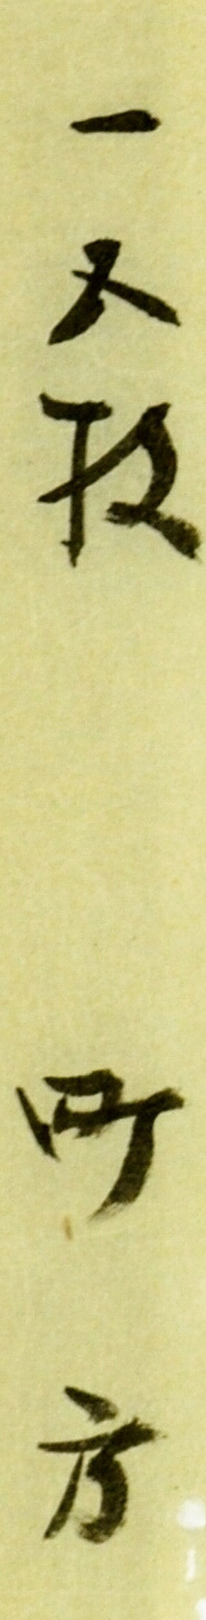一五枚町方
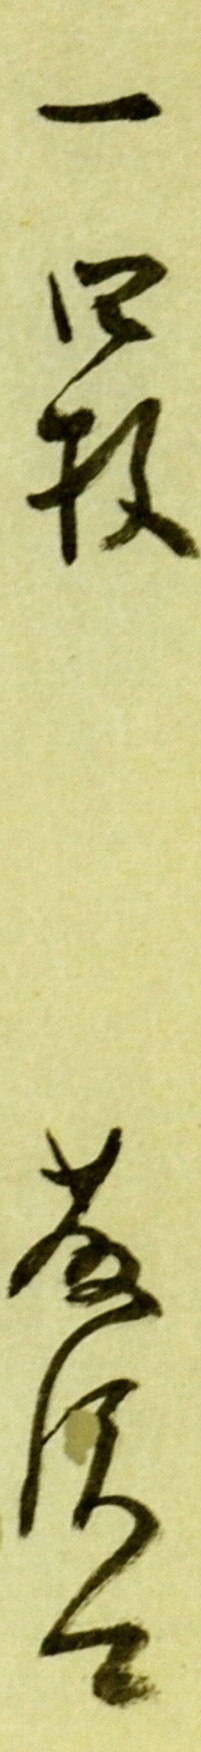一四枚藤沢郷
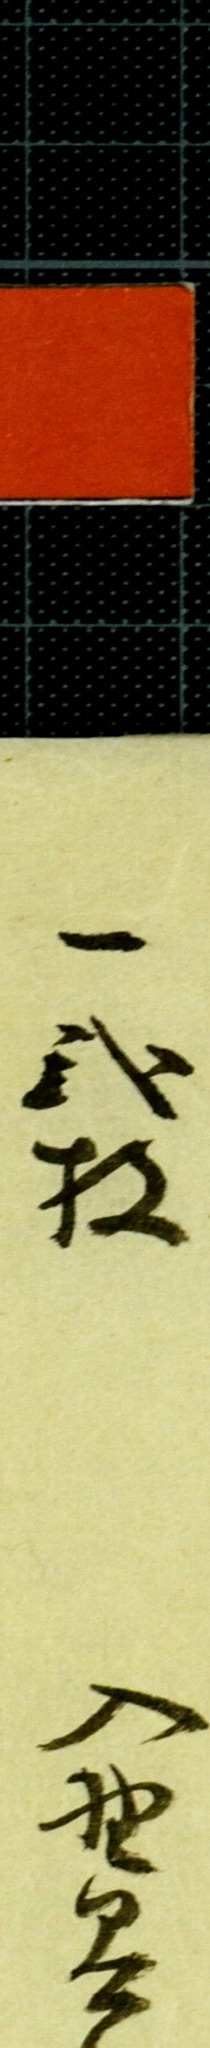一弐枚入野谷郷
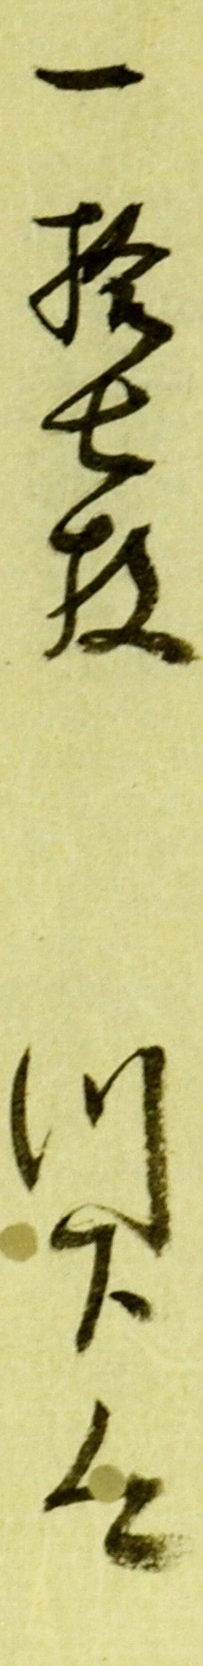一拾七枚川下郷
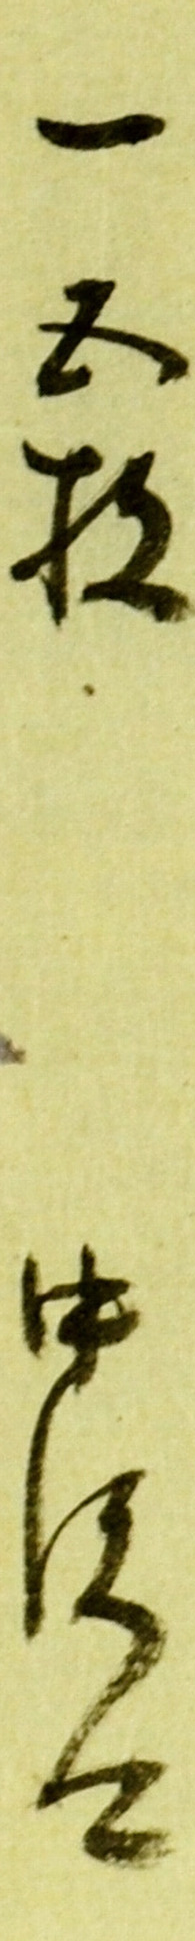一五枚中沢郷
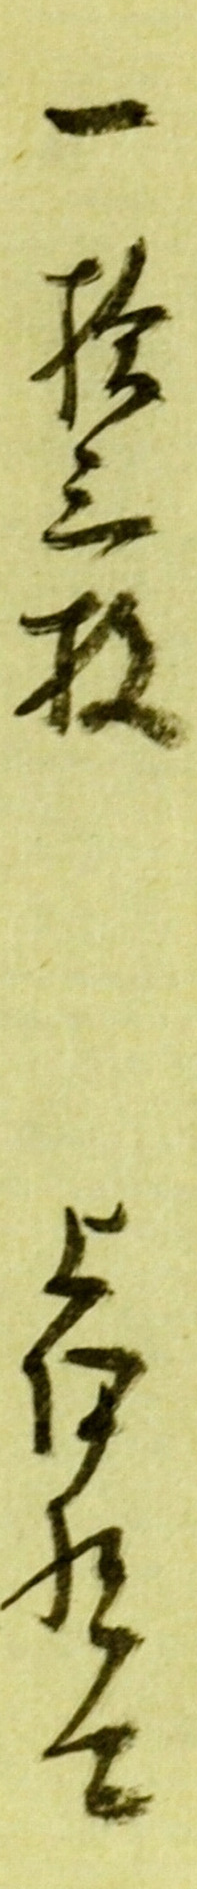一拾三枚上伊那郷
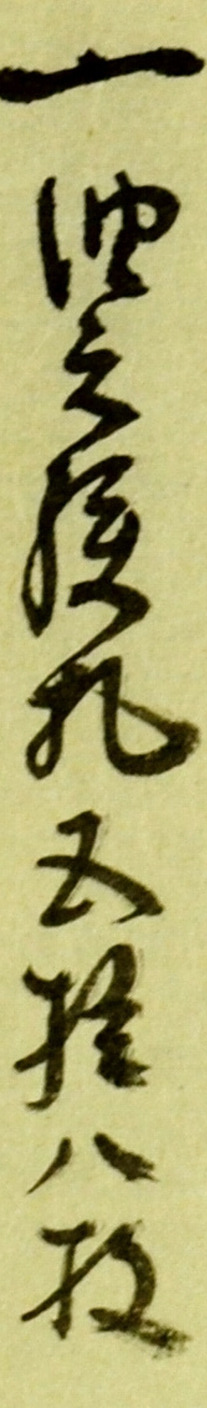〆油元絞札五拾八枚
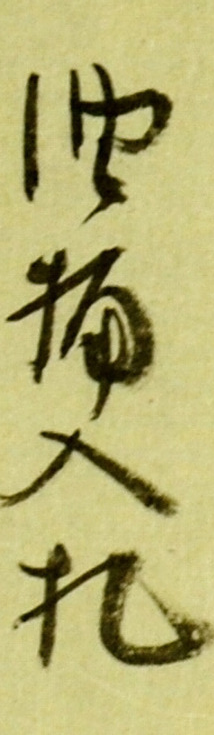油桶入札

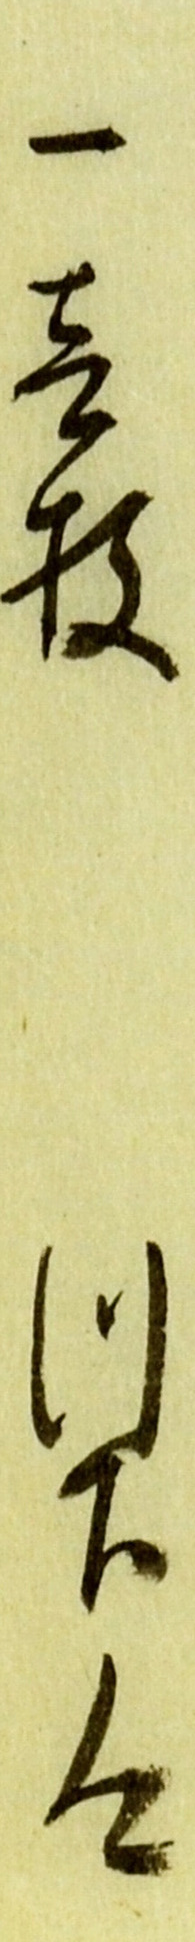一壱枚川下郷
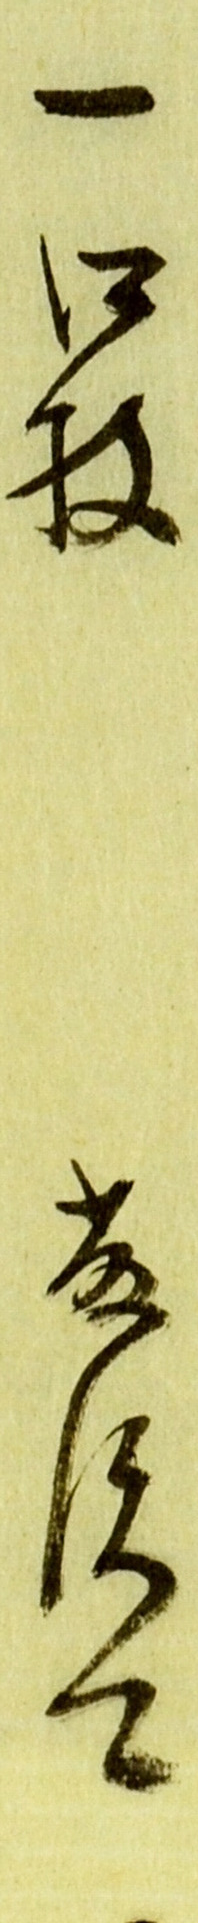一四枚藤沢郷
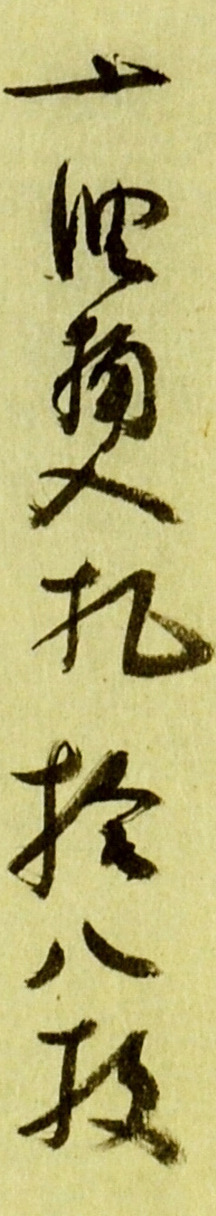〆油桶入札拾八枚
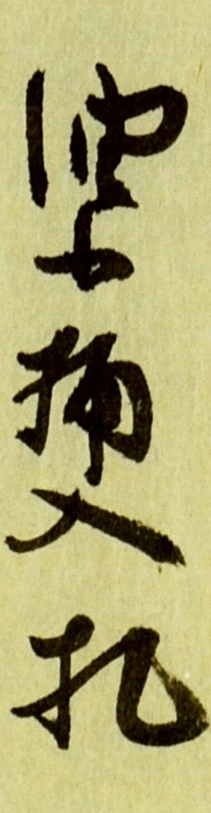油小桶入札
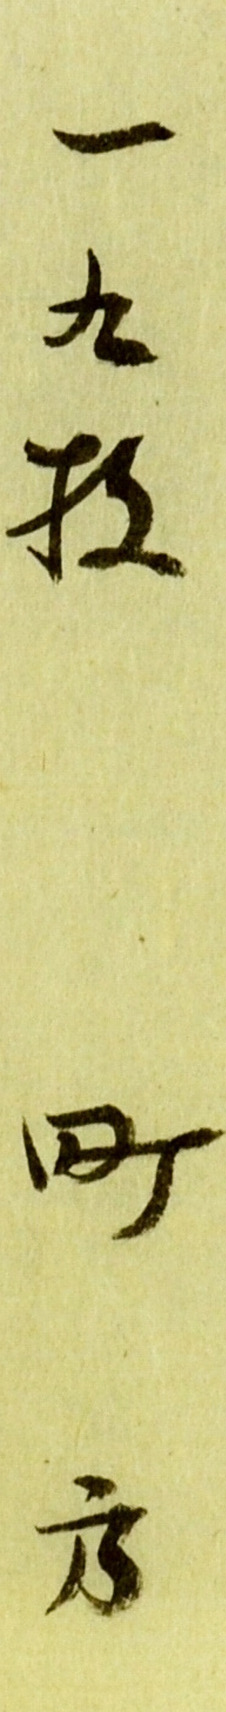一九枚町方
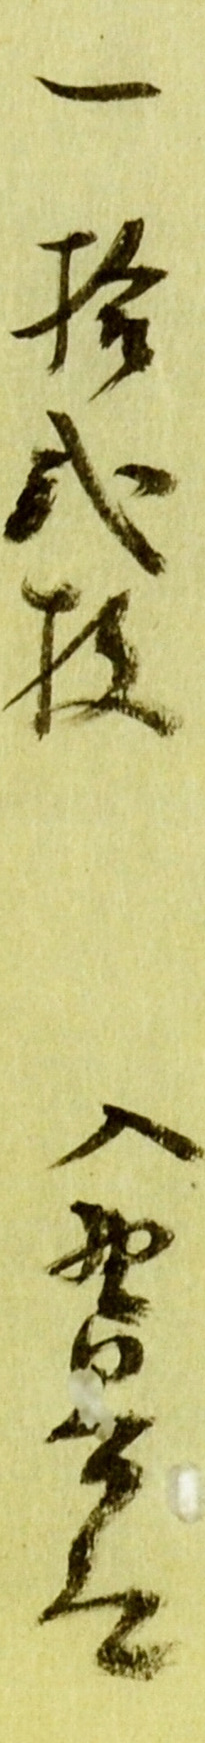一拾弐枚入野谷郷
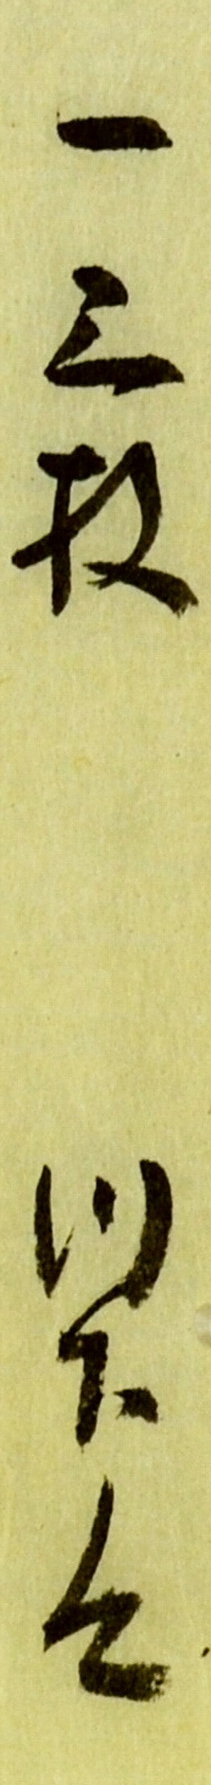一三枚川下郷
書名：午年諸郷并町方鑑札渡覚
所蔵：伊那市立高遠町図書館・合同会社AMANE
